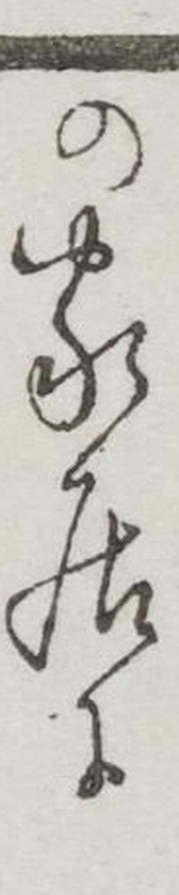の家居に
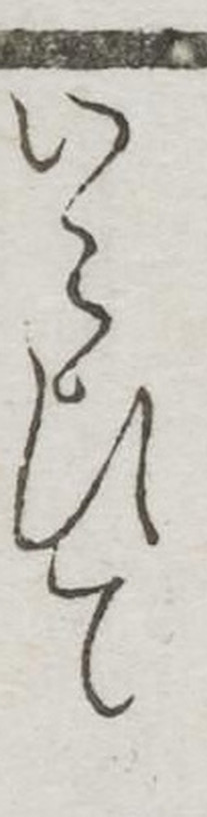いこひて
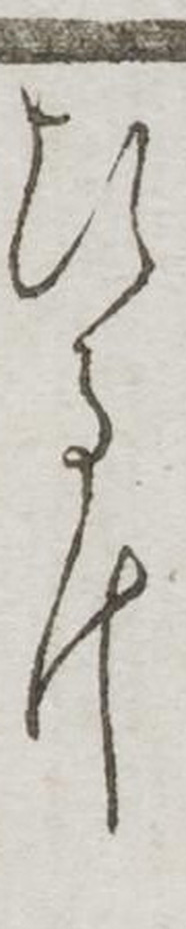ひるけ
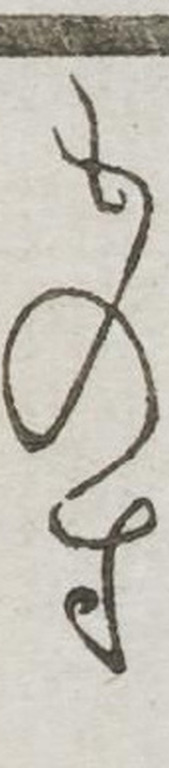ものす

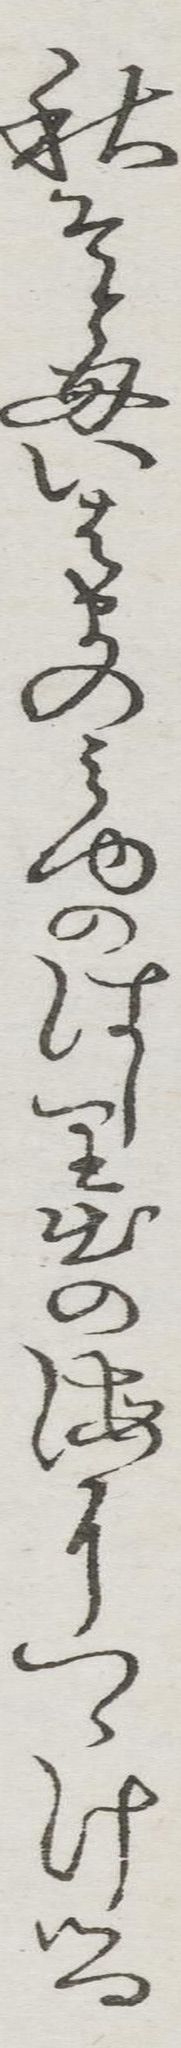秋そともいはまのみゆのはしり出の海につゝける
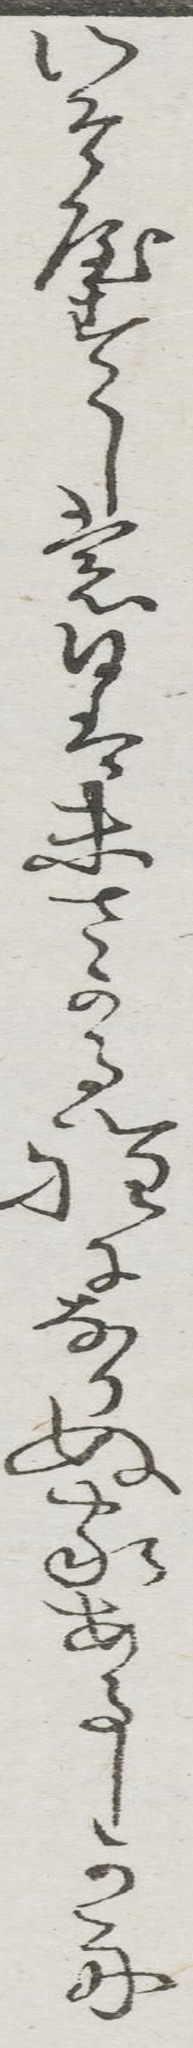いそやすくしも日は未さかる程になりぬ家あるしか舟
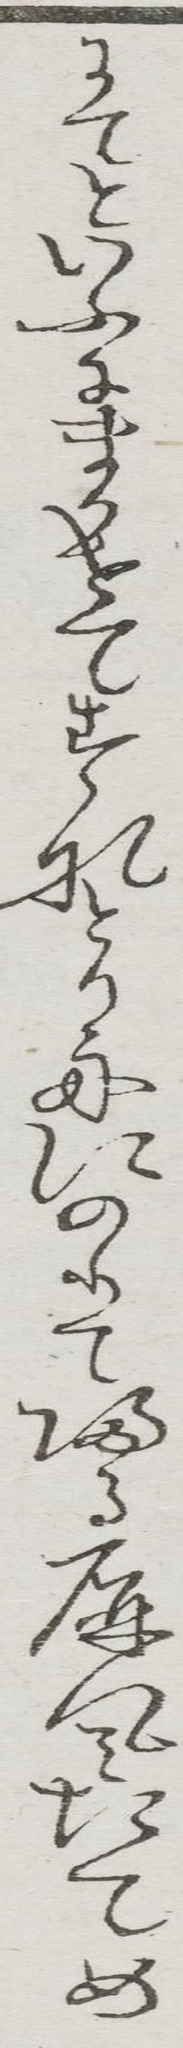にてといふにまかせてすなとり舟にのりて帰る屏風をたてめ
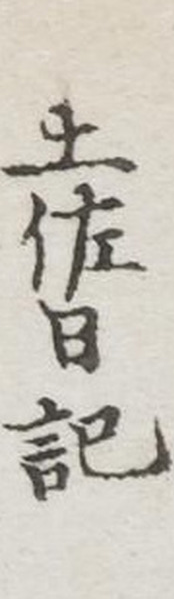土佐日記
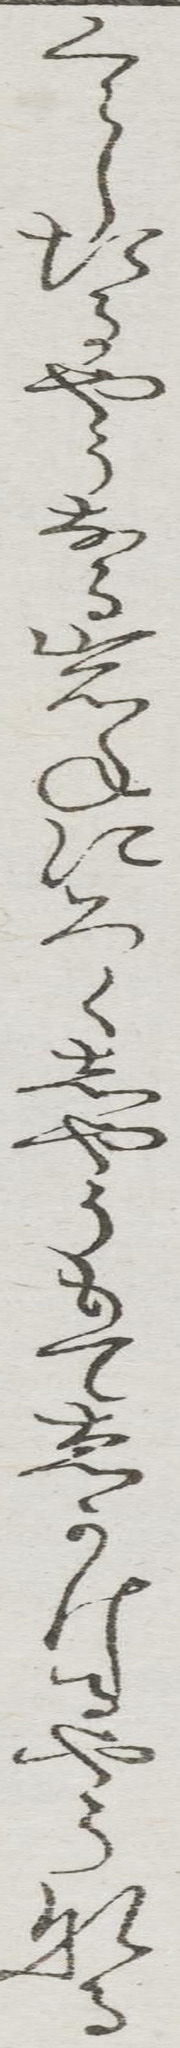くらしたるやうなる岩ねにろくしやうもてゑかけるやうなる
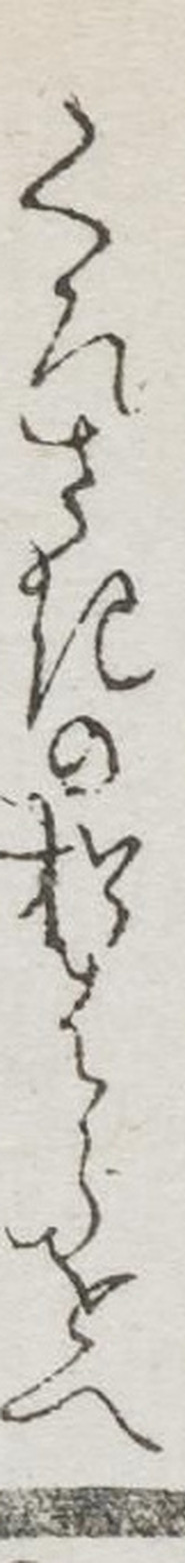くろさきの松はらをへ
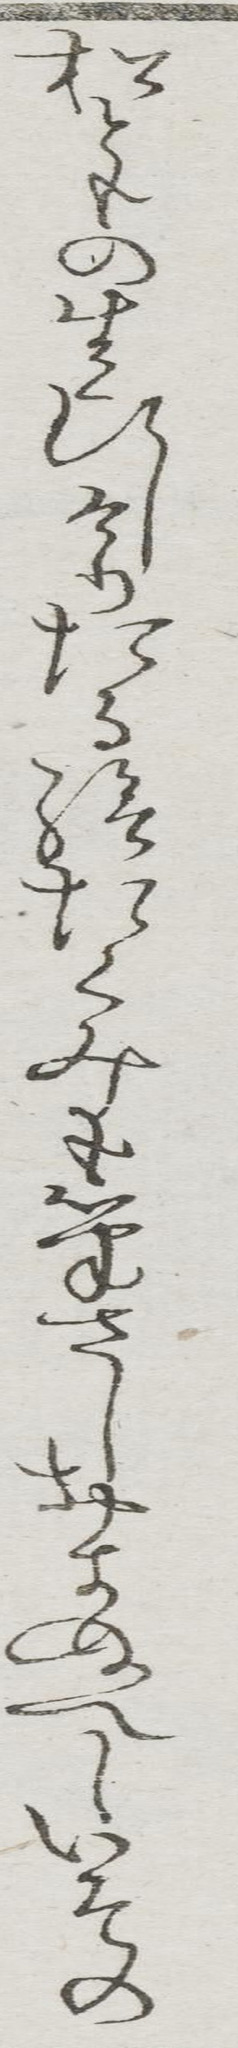松ともの生ひしけりたる絵たくみも筆さしさおきぬへしいその
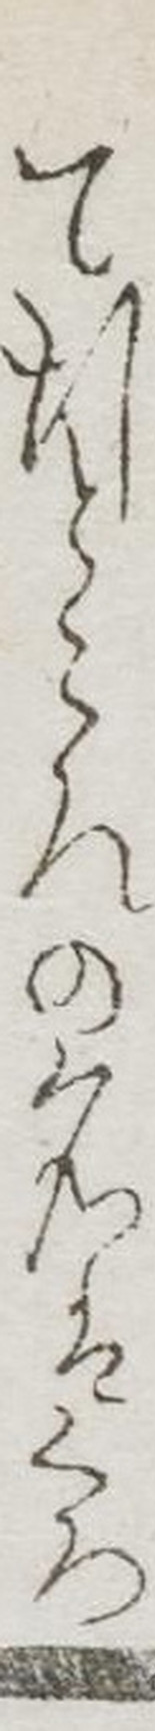て行ところの名はくろ
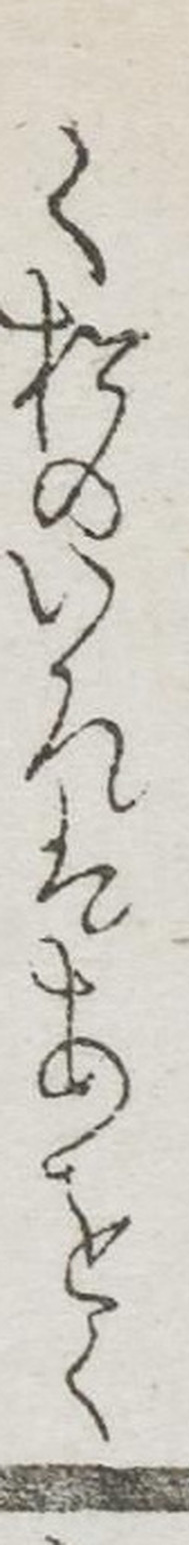く松のいろはあをく
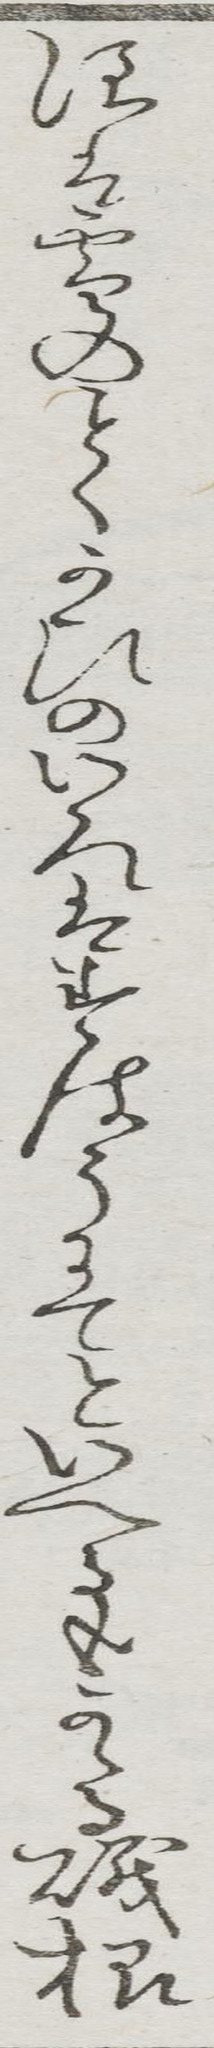清水雪のことくかひのいろはすはうにてといへるもかゝる磯根
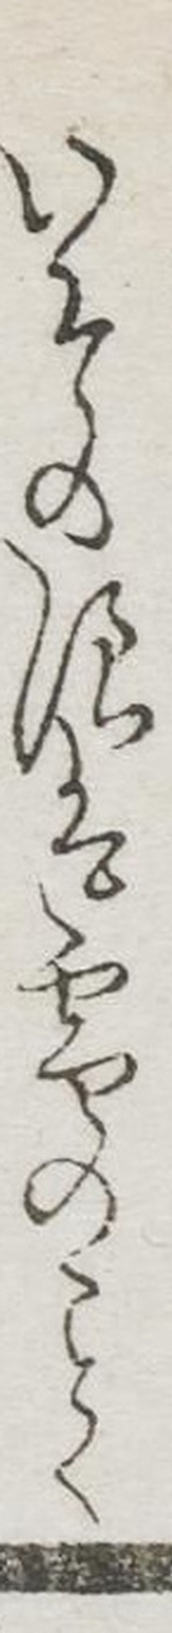いその浪は雪のことく
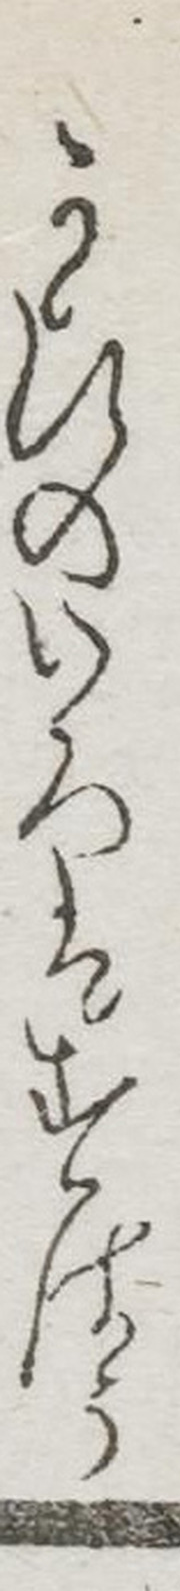かひのいろはすはう
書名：挿画熱海日記　全
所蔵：東京大学地震研究所図書室 Earthquake Research Institute Library, The University of Tokyo, JAPAN
